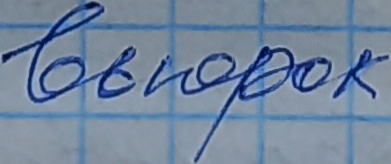вьюрок
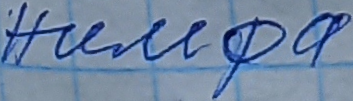нимфа
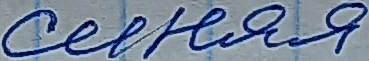синяя
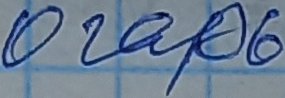огарь
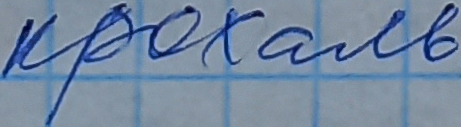крохаль
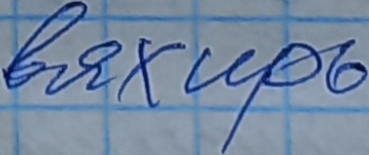вяхирь
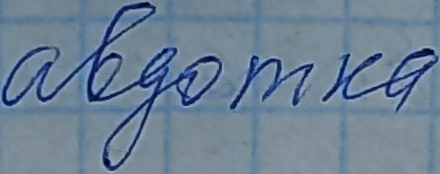авдотка
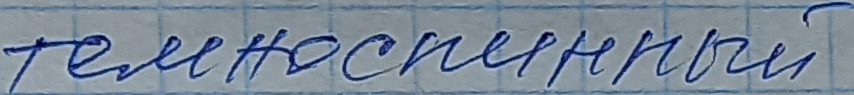темноспинный
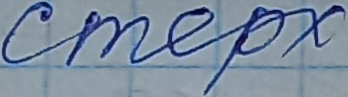стерх
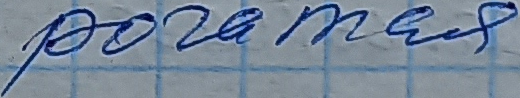рогатая
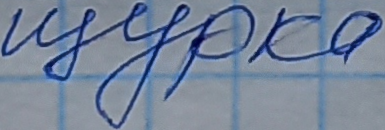щурка
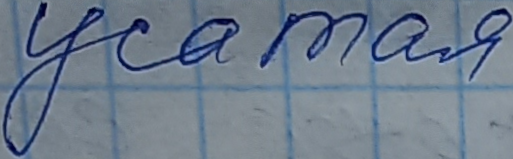усатая
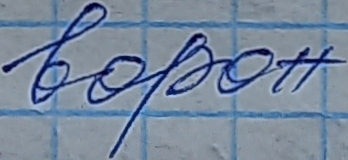ворон
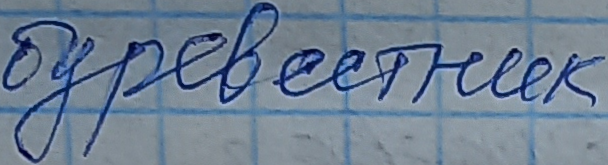буревестник
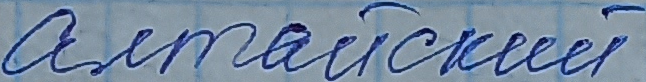алтайский
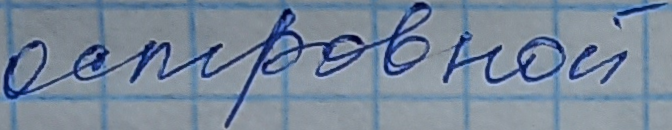островной
